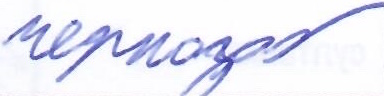чернозоб
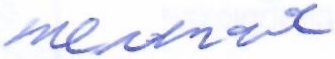желтая
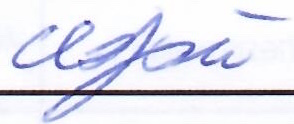седой
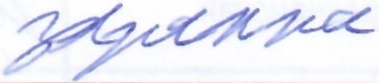заряднка
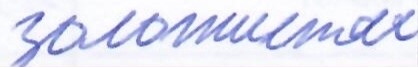золотистая
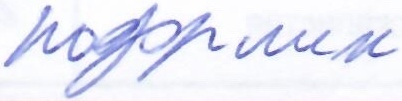подорлик
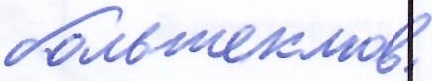большеклюв.
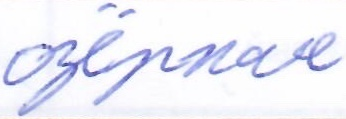озёрная
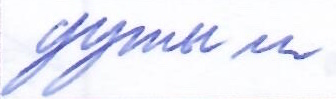дутыш
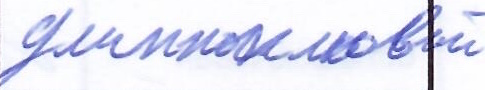длинноклювьй
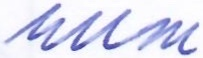чиж
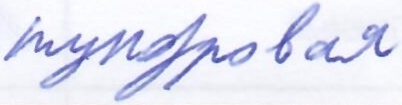тундровая
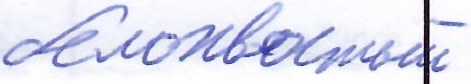белохвостый
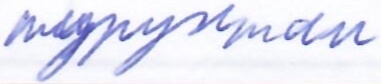турухтап
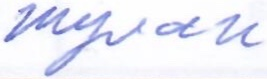жулан
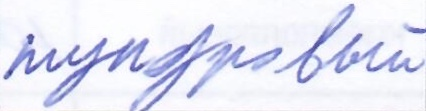тундровый
